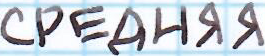средняя
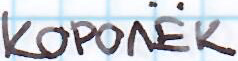королёк
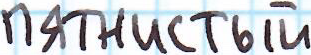пятнистый
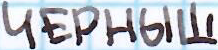черныш
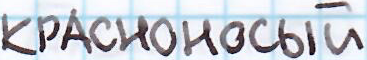красноносый
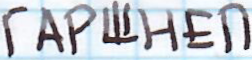гаршнеп
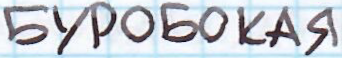буробокая
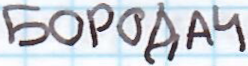бородач
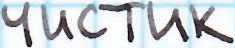чистик
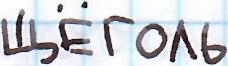щёголь
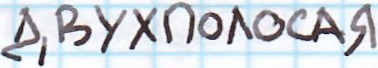двухполосая
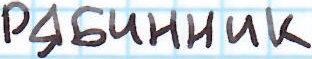рябинник
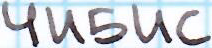чибис
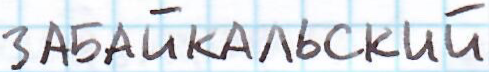забайкальский
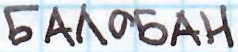балобан
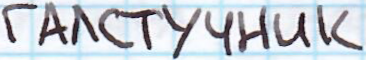галстучник
